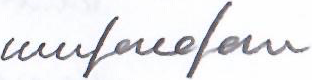широкорот
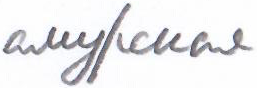амурская
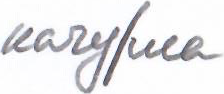качурка
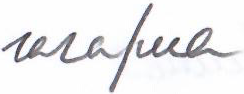гагарка
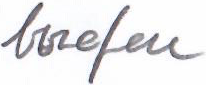вьюрок
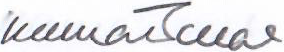китайская
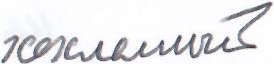хохлатый
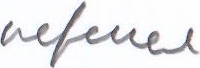перепел
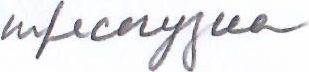трясогузка
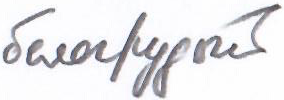белогрудый
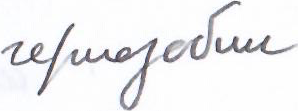чернозобик
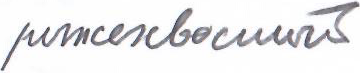рыжехвостый
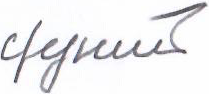средний
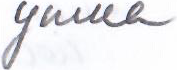утка
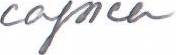саджа
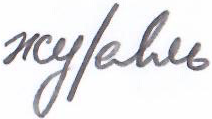журавль
